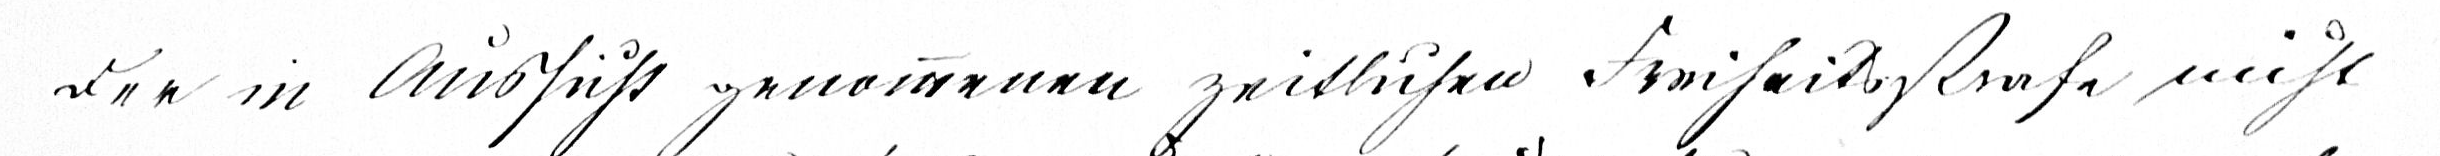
der in Aussicht genommenen zeitlichen Freiheitsstrafe nicht
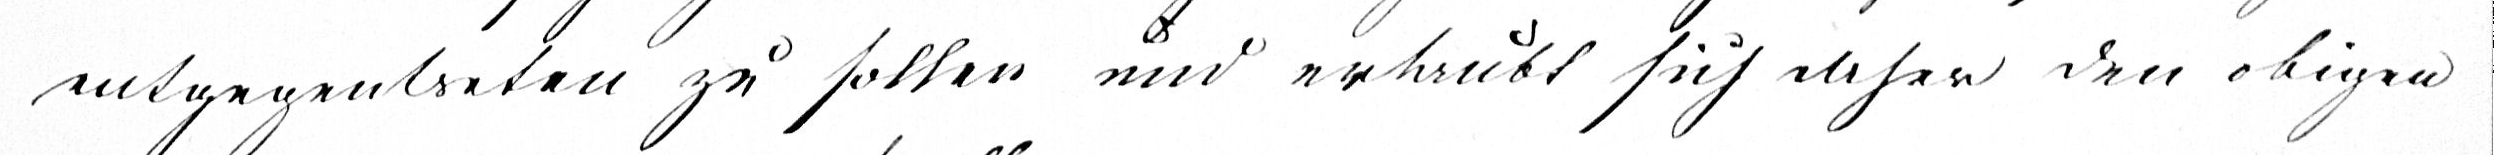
entgegentreten zu sollen und erlaubt sich daher den obigen
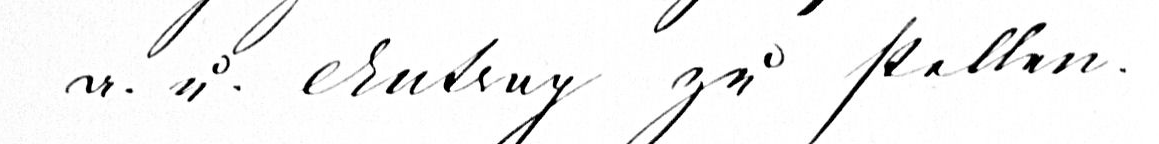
a. u. Antrag zu stellen.
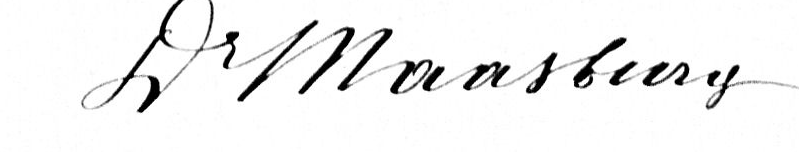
Dr Maasburg
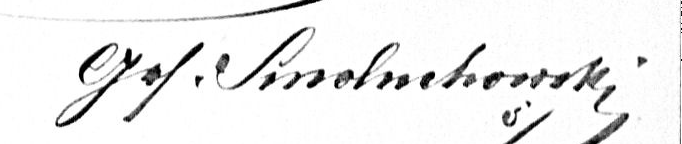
Ges. Sxxechowski
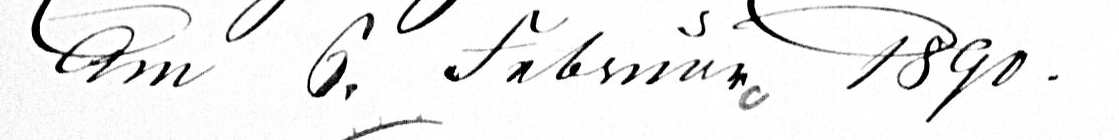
Am 6. Februar 1890.
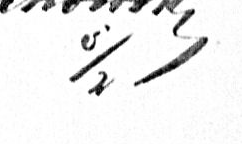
5/2
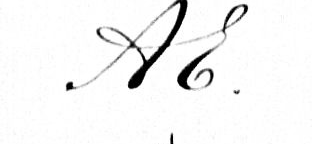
AE.
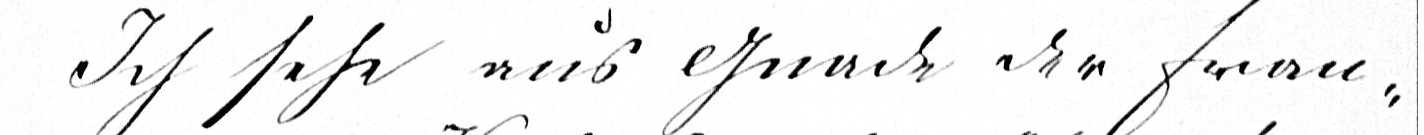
Ich sehe aus Gnade der Fran¬
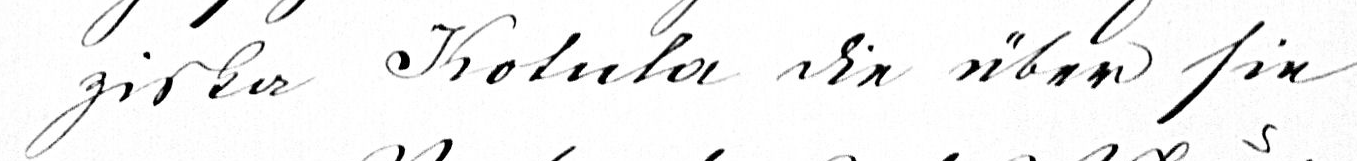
ziska Kotula die über sie
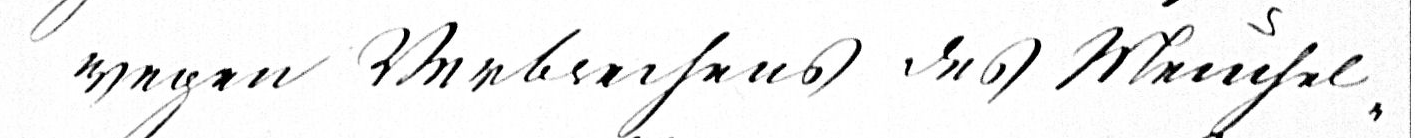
wegen Verbrechens des Meuchel¬
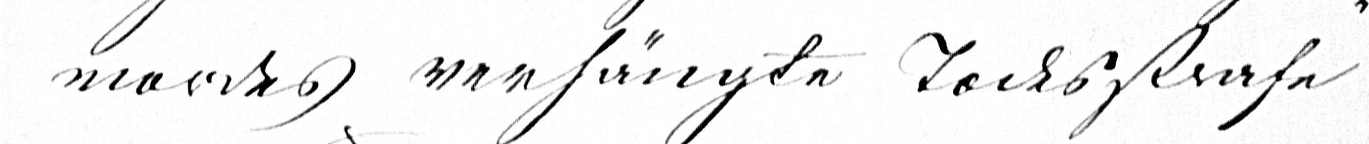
mordes verhängte Todesstrafe
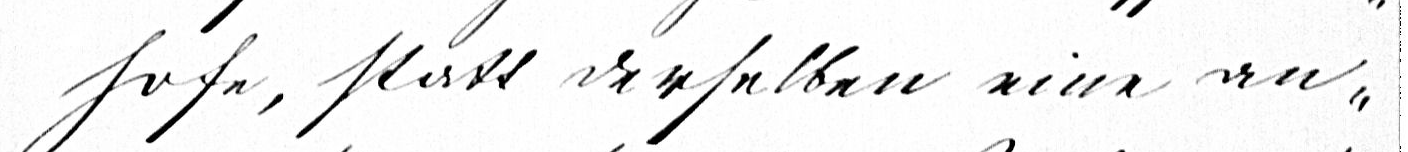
hofe, statt derselben eine an¬
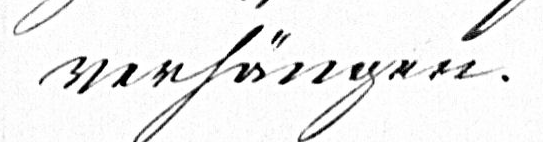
verhängen.
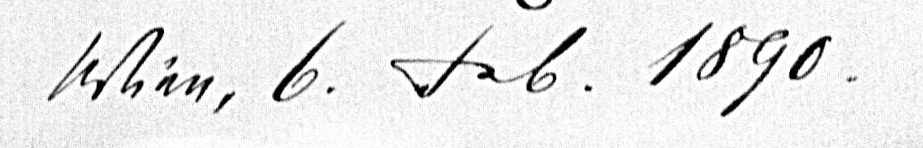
Wien, 6. Feb. 1890.
